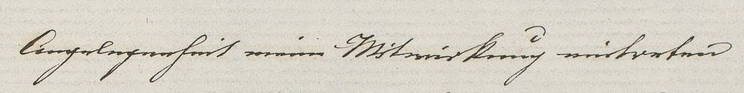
Angelegenheit meine Mitwirkung eintreten
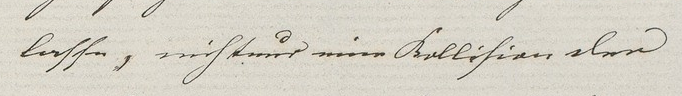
lasse, nicht nur eine Kollision der
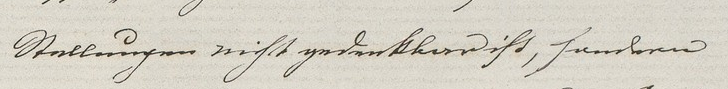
Stellungen nicht gedenkbar ist, sondern
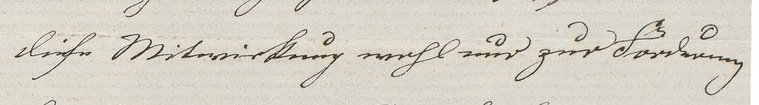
diese Mitwirkung wohl nur zur Forderung
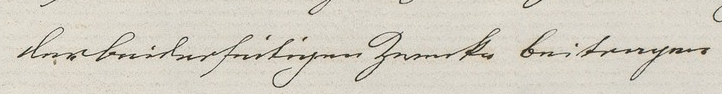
der beiderseitigen Zwecke beitragen
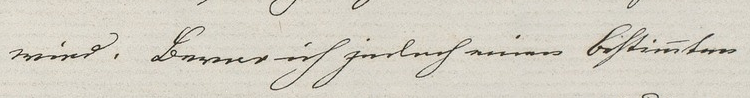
wird. Bevor ich jedoch einen bestimmten
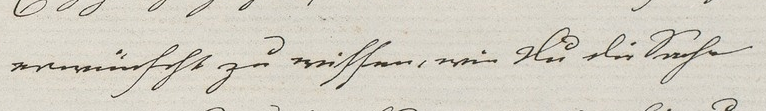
erwünscht zu wissen, wie Du die Sache
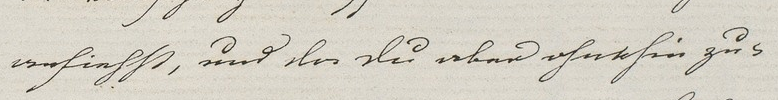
ansiehst, und da Du aber ohnehin zu-
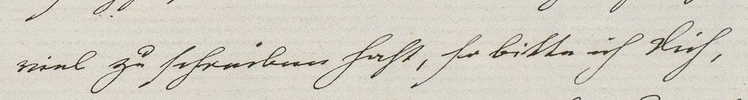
viel zu schreiben hast, so bitte ich Dich,
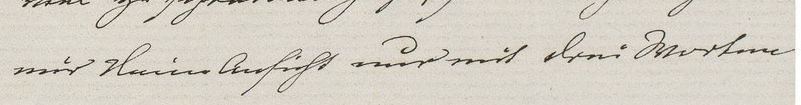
mir Deine Ansicht nur mit drei Worten
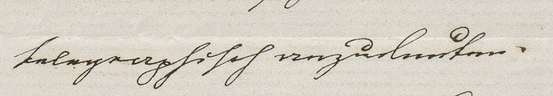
telegraphisch anzudeuten.
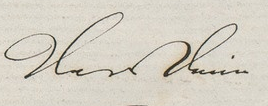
Der Deine
